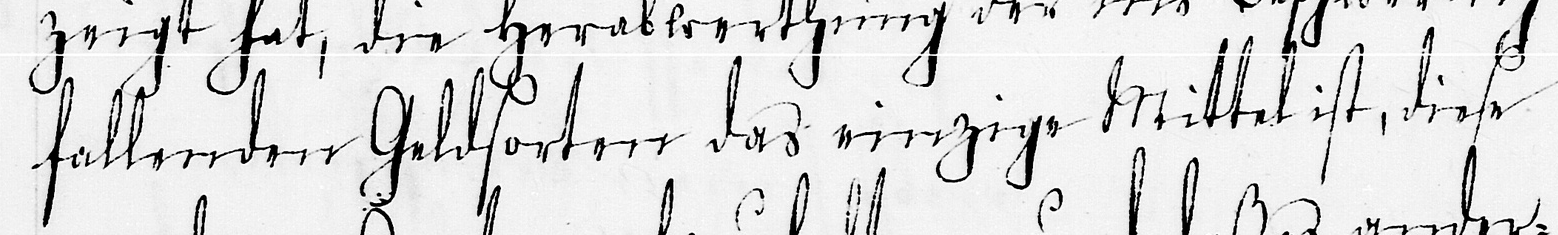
fallenden Geldsorten das einzige Mittel ist, diese
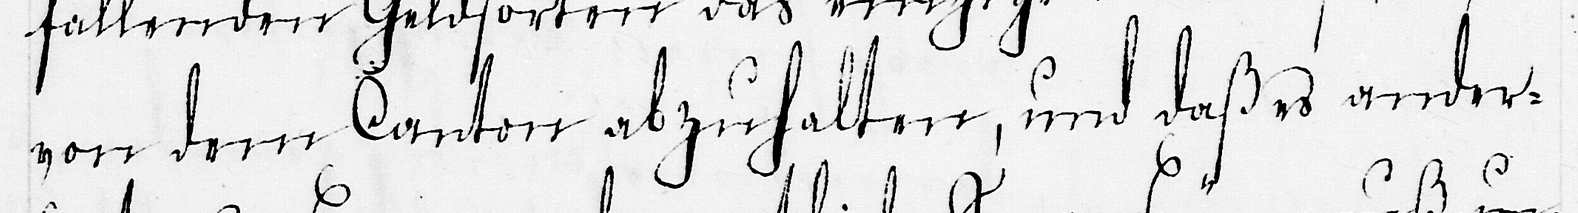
von dem Canton abzuhalten, und daß es ander¬
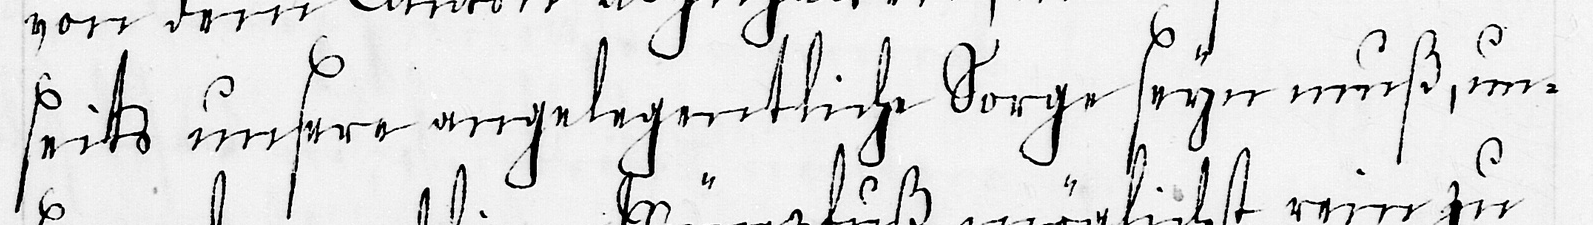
seits unsere angelegentliche Sorge seyn muß, un¬
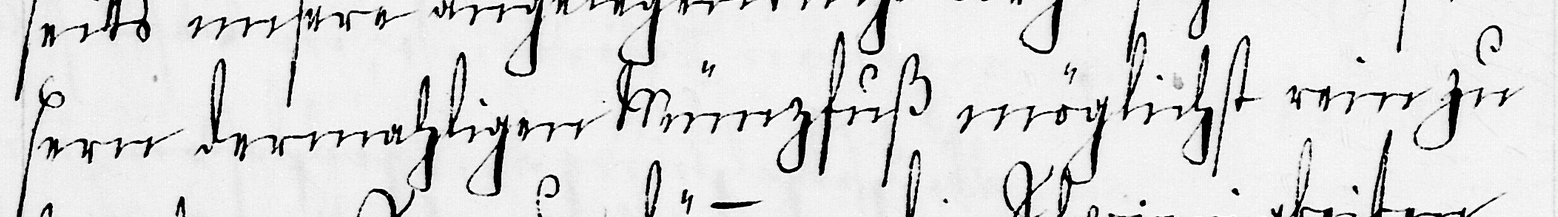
sern dermahligen Münzfuß möglichst rein zu
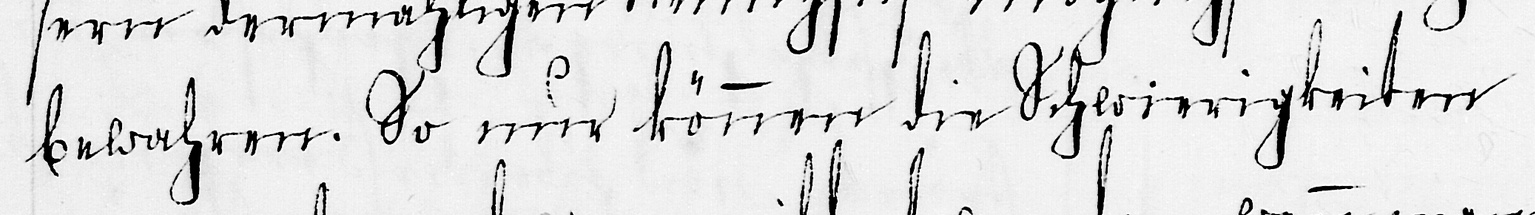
bewahren. So nur können die Schwierigkeiten
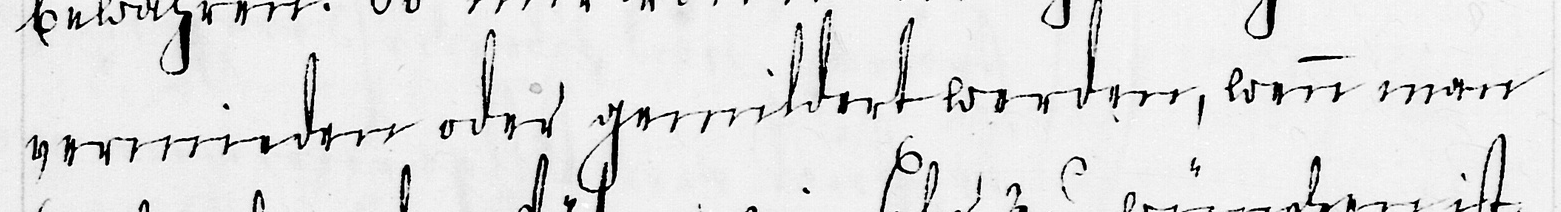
vermieden oder gemildert werden, wenn man
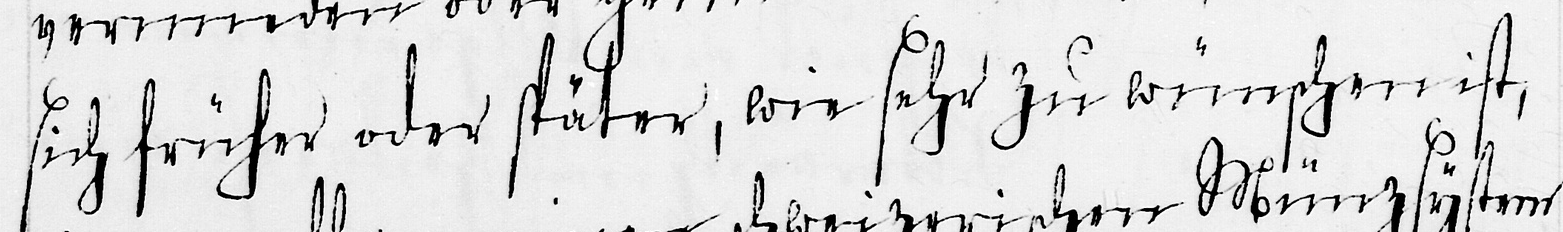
sich früher oder später, wie sehr zu wünschen ist,
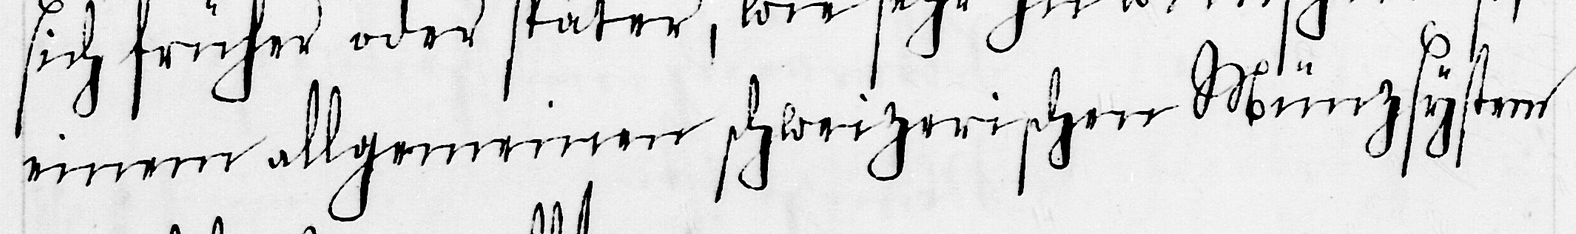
einem allgemeinen schweizerischen Münzsystem
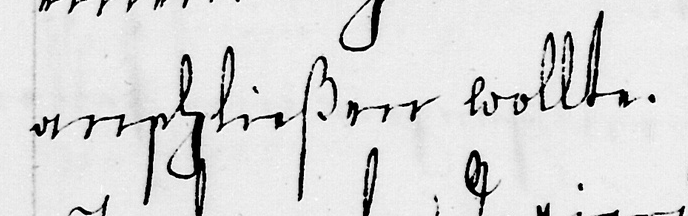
anschließen wollte.
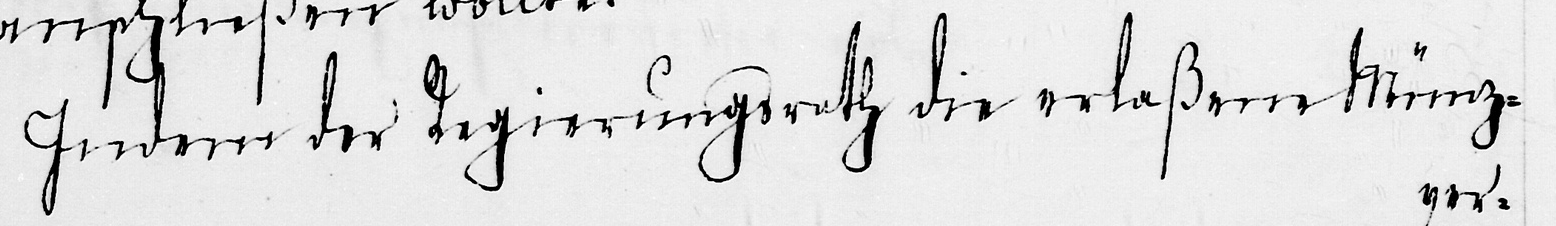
Indem der Regierungsrath die erlaßene Münz-
